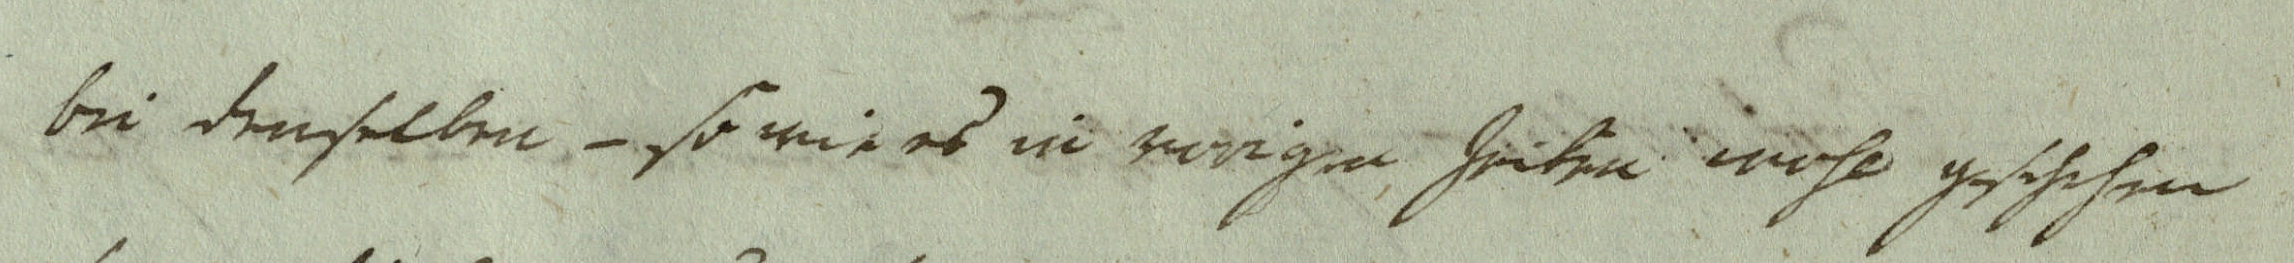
bei denselben - so wie es in vorigen Zeiten wohl geschehen
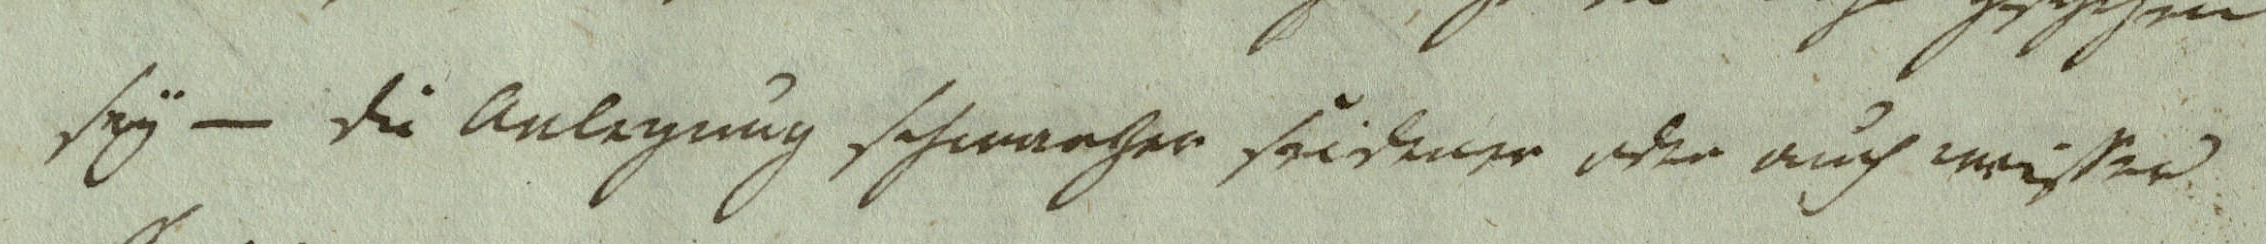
seÿ - die Anlegung schwarzer seidener oder auch weisser
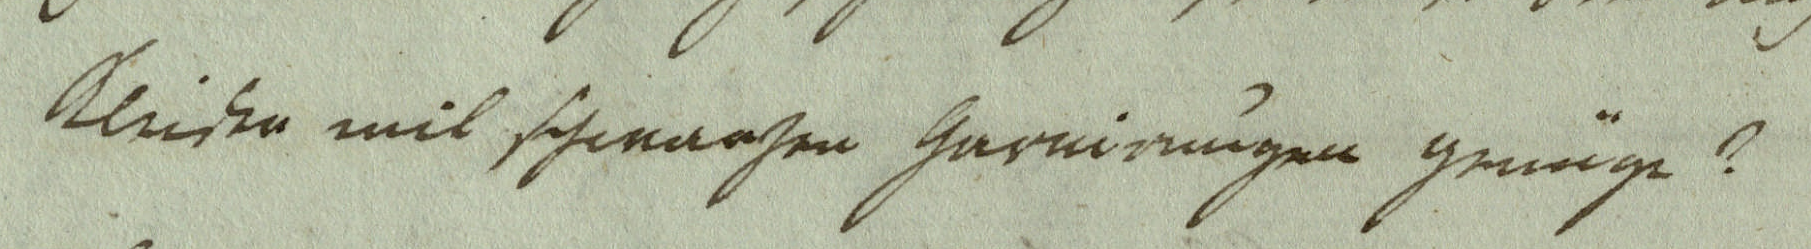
Kleider mit schwarzen Garnirungen genüge?
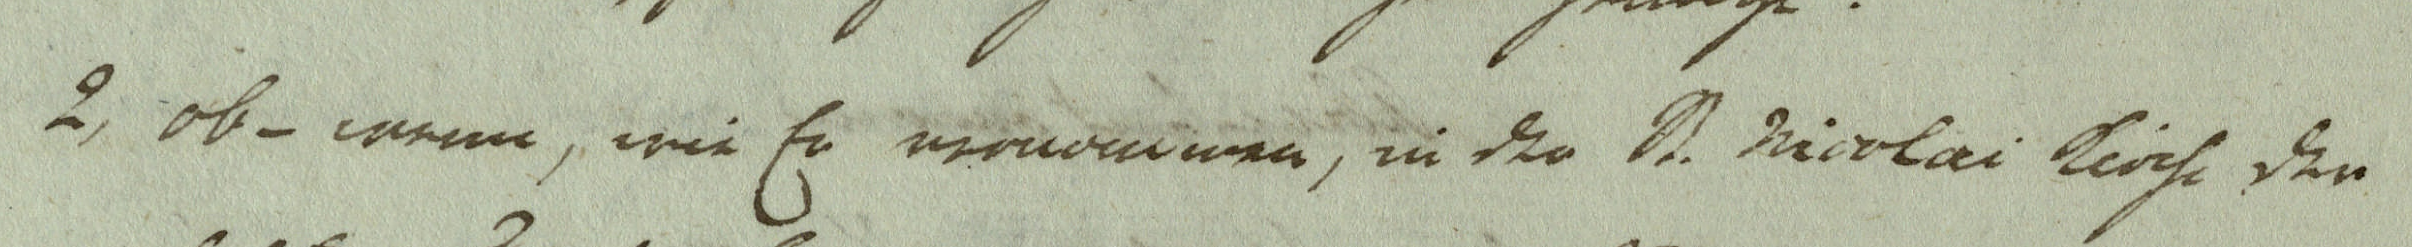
2, ob - wenn, wie Er vernommen, in der St. Nicolai Kirche der
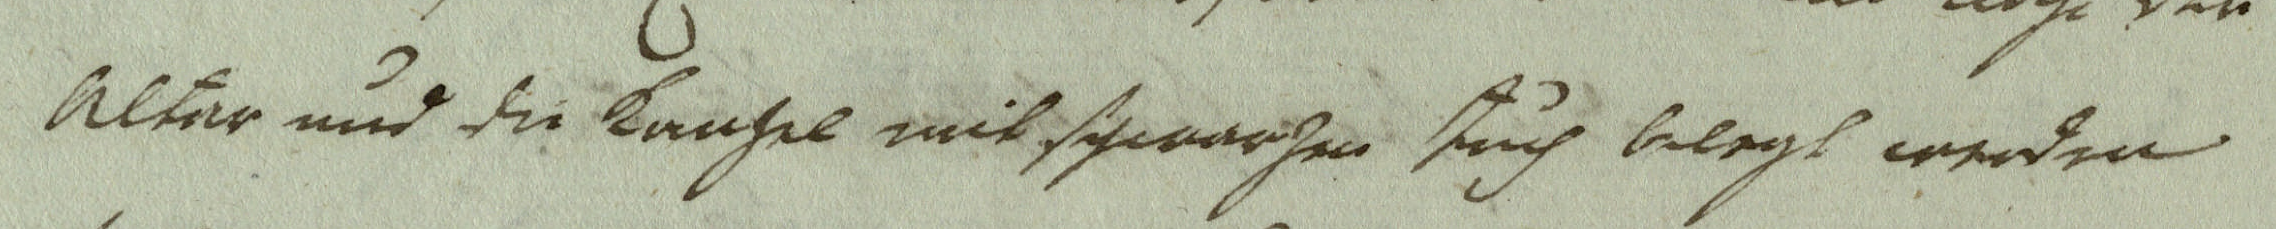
Altar und die Kanzel mit schwarzem Tuch belegt werden
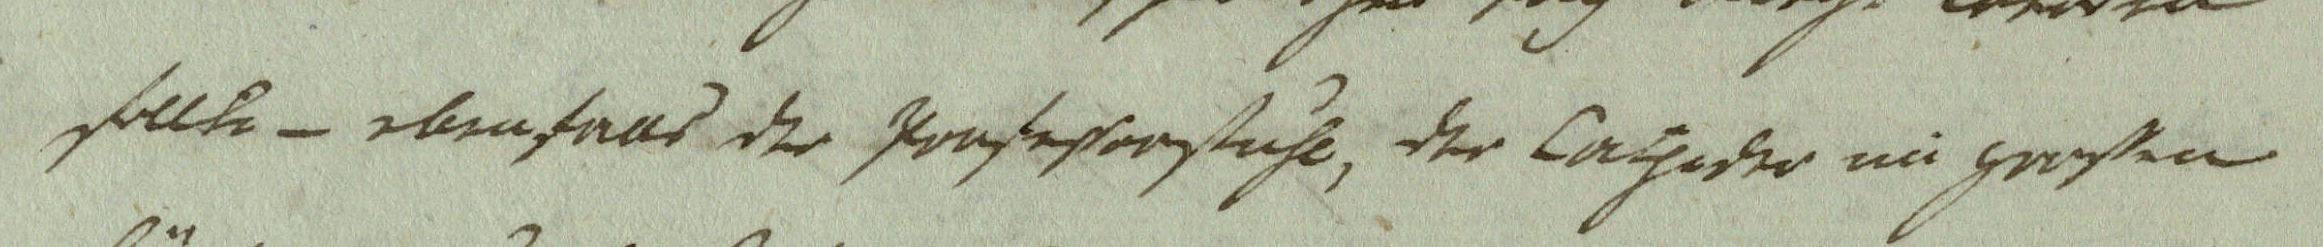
sollte - ebenfalls der Professorenstuhl, der Catheder im großen
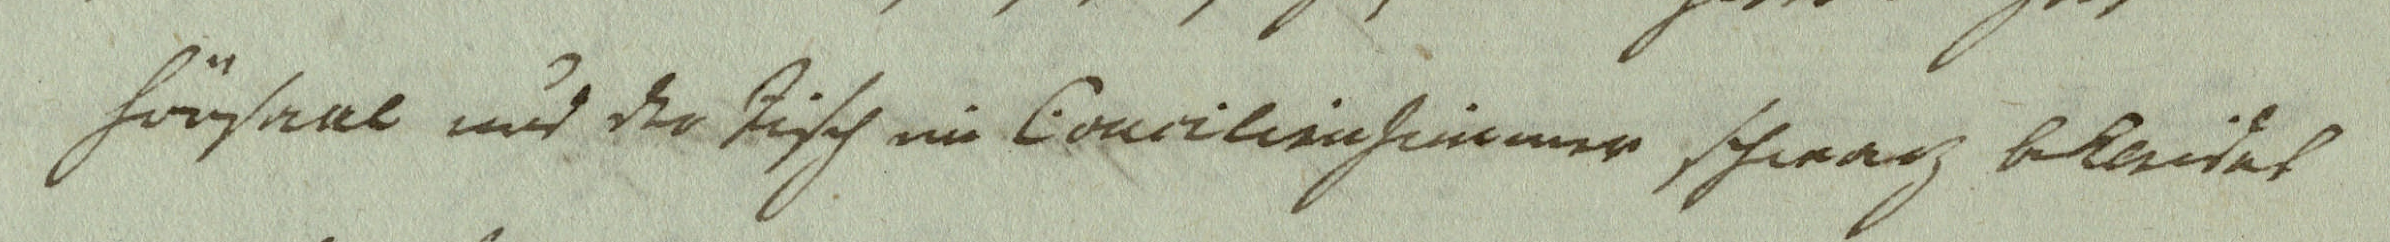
hörsaal und der Tisch im Concilienzimmer schwarz bekleidet
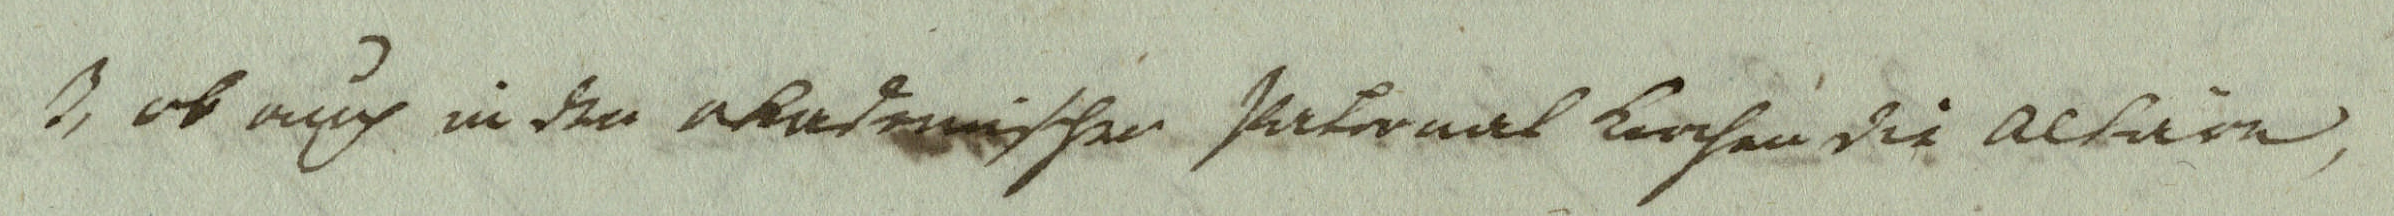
3, ob auch in den akademischen Patronat Kirchen die Altäre,
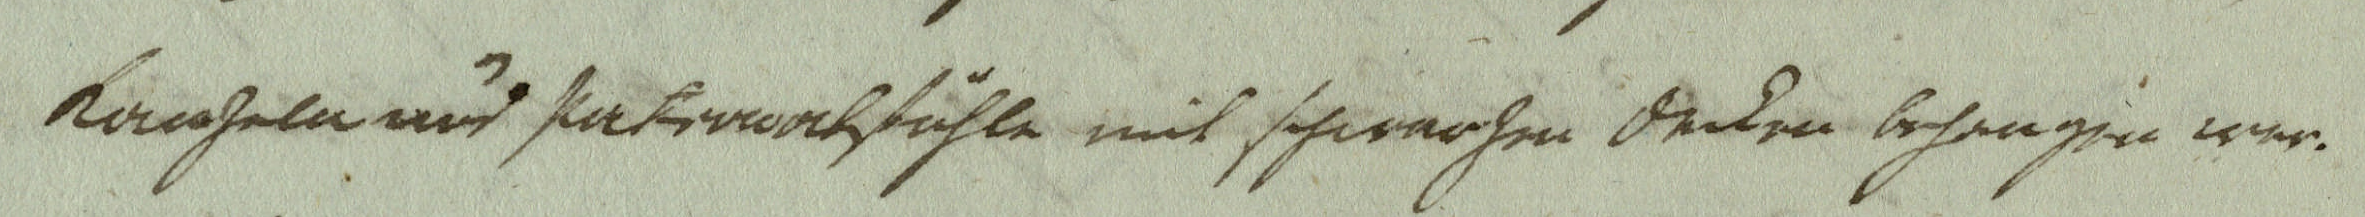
Kanzeln und Patronatstühle mit schwarzen Decken behangen wer¬
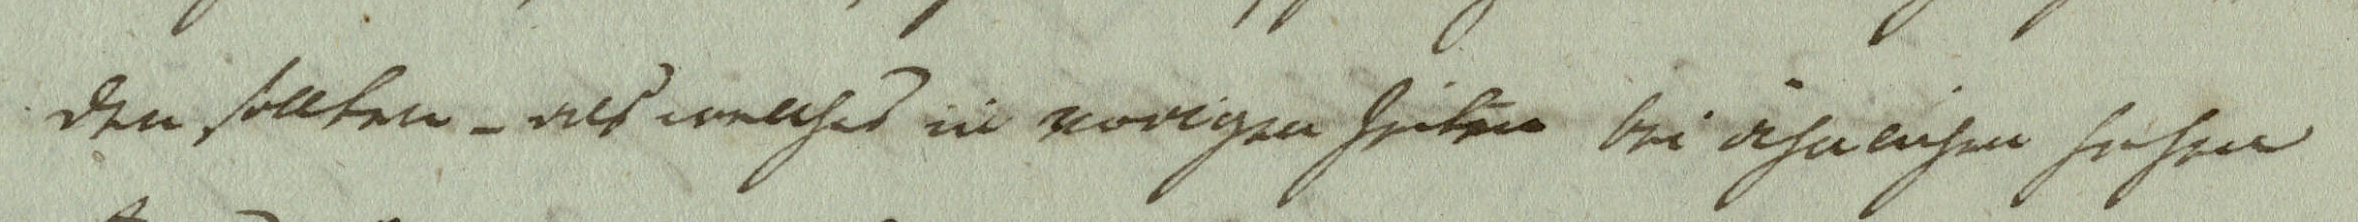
den sollten - als welches in vorigen Zeiten bei ähnlichen hohen
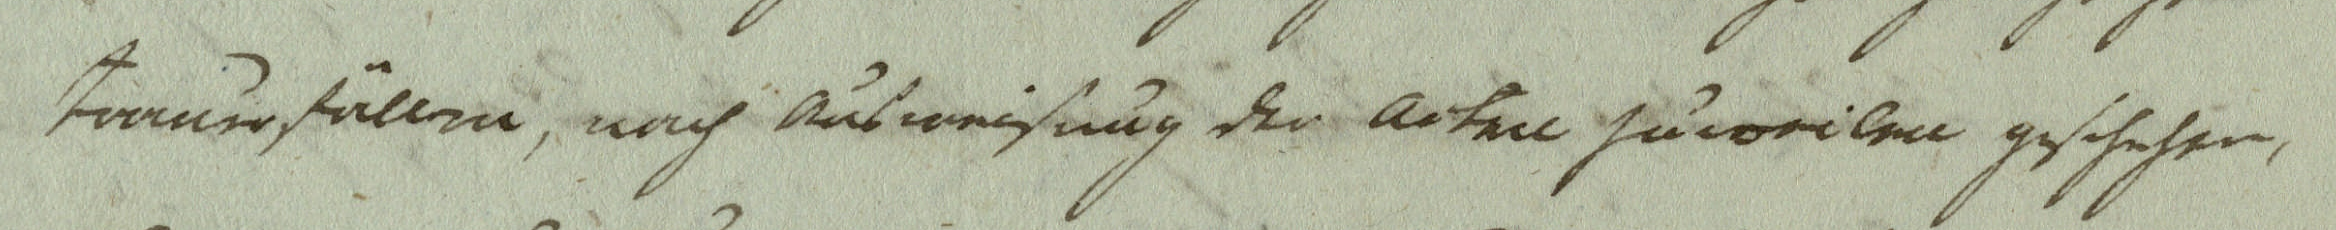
Trauerfällen, nach Ausweisung der Acten zuweilen geschehen,
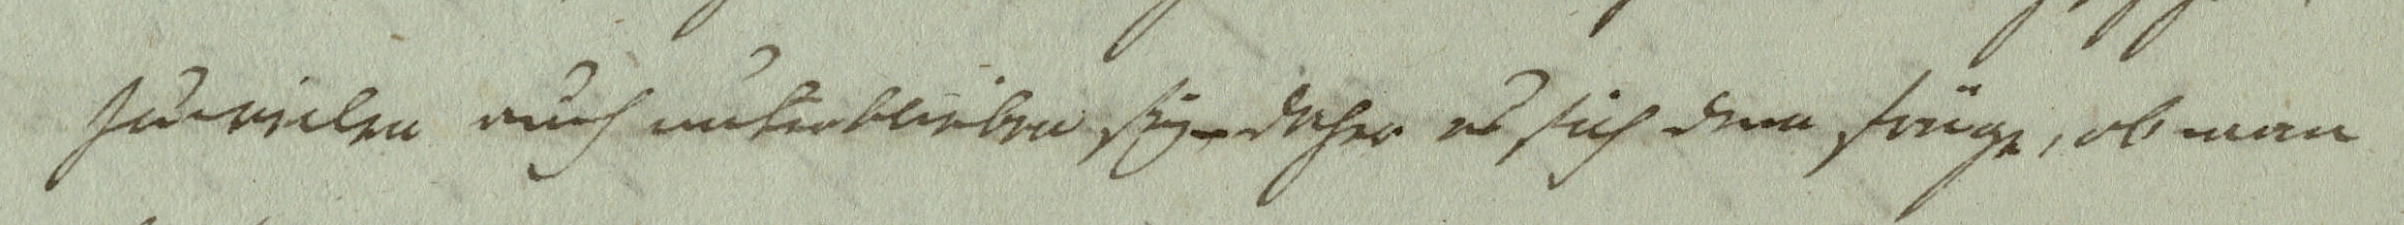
zuvielen auch unterblieben seÿ - daher es sich denn früge, ob man
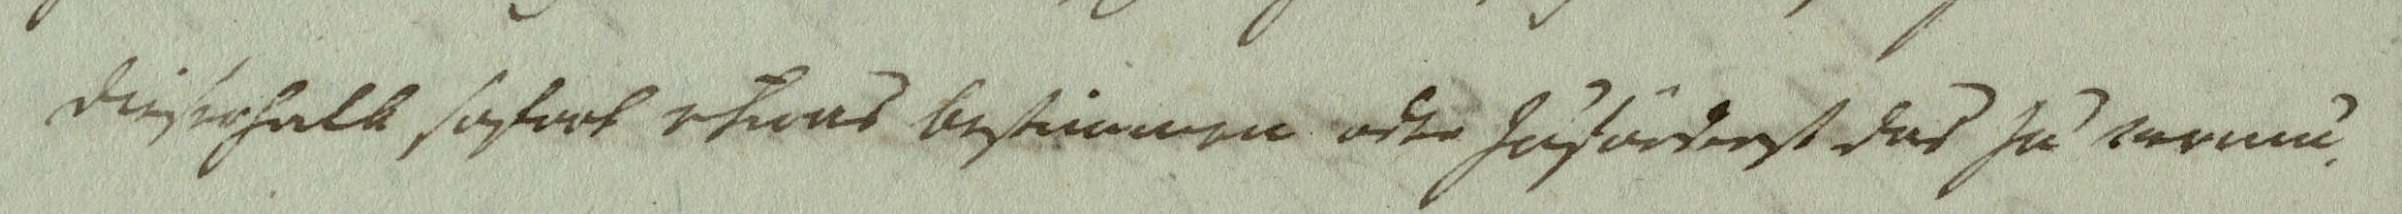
dieserhalb sofort etwas bestimmen oder zuförderst das zu vermu¬
